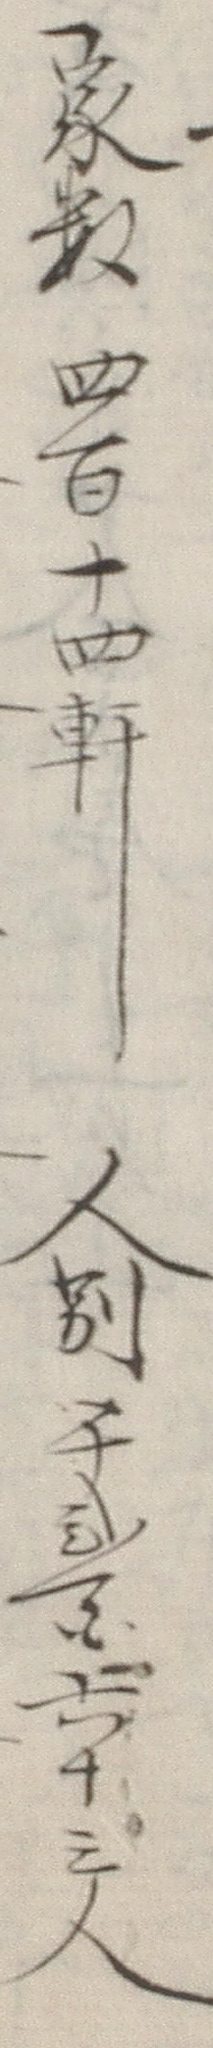家数四百十四軒人別千弐百六十三人
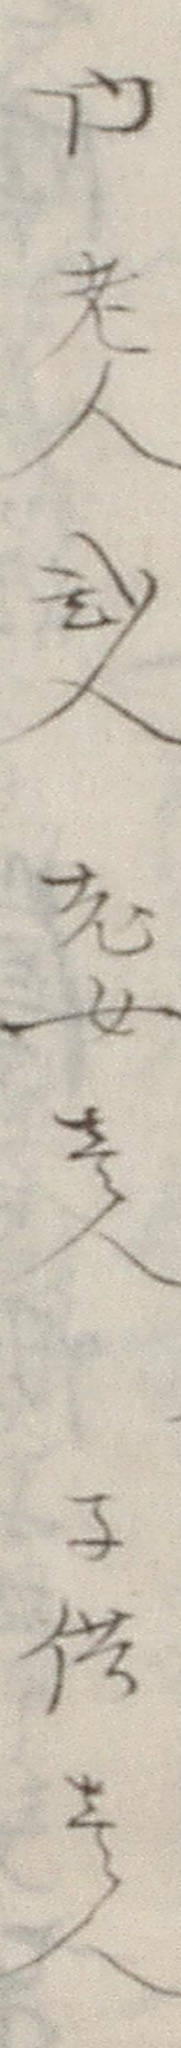内老人弐人老女壱人子供壱人
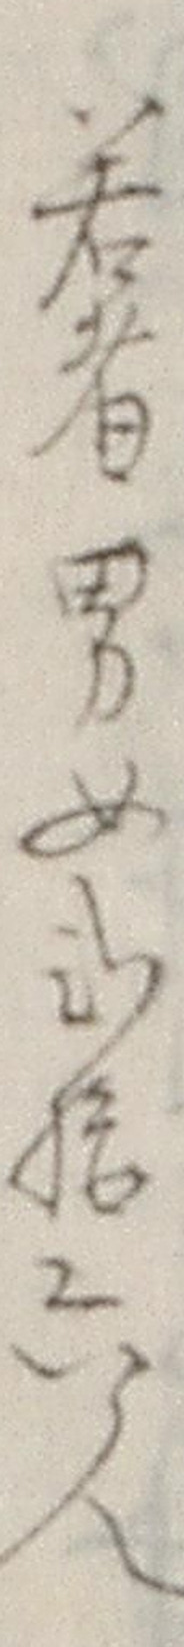若者男女弐拾六人
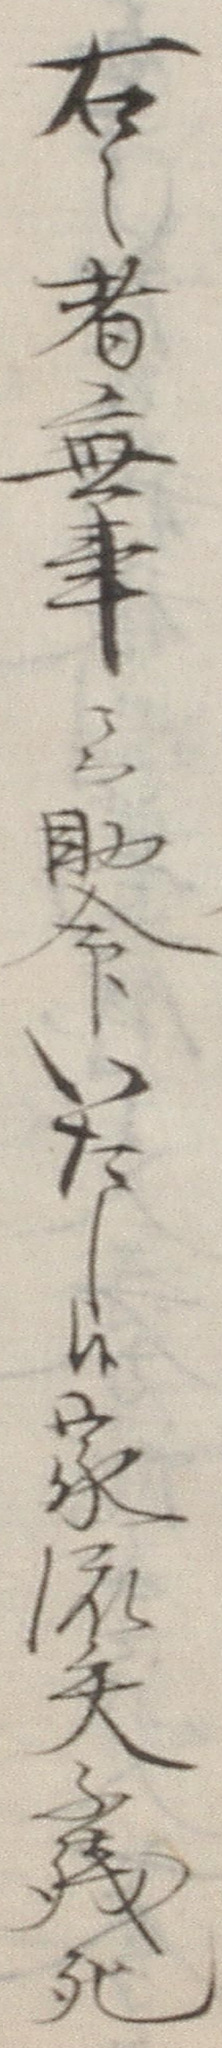右之者無事ニ而助命いたし候家流失不残死
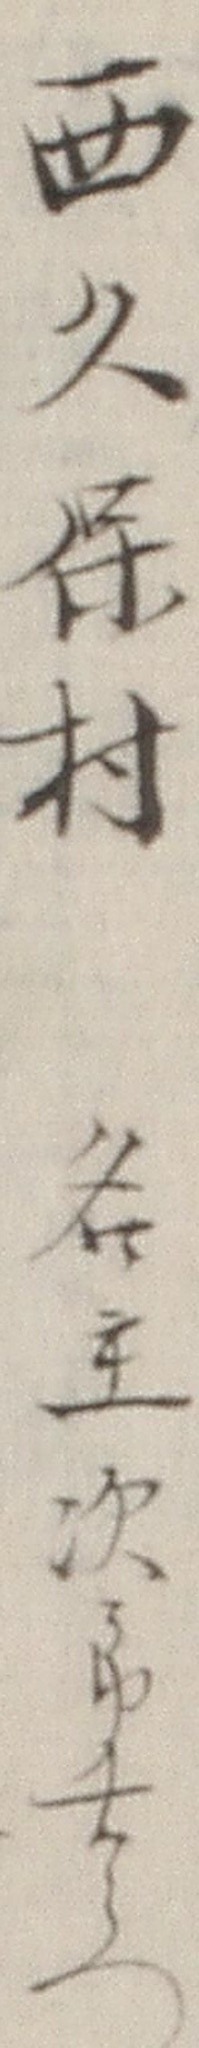西久保村名主次郎右衛門
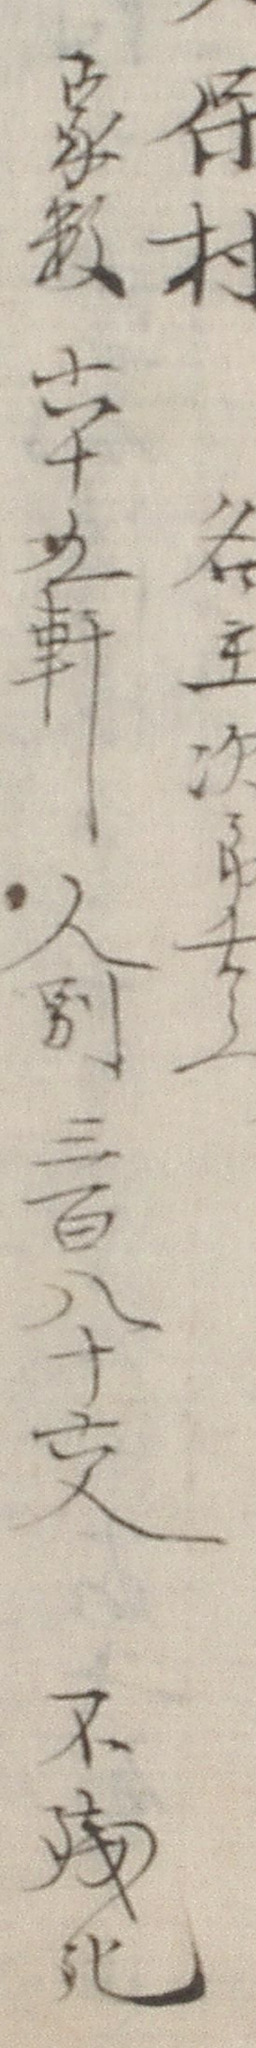家数六十九軒人別三百八十六人不残死
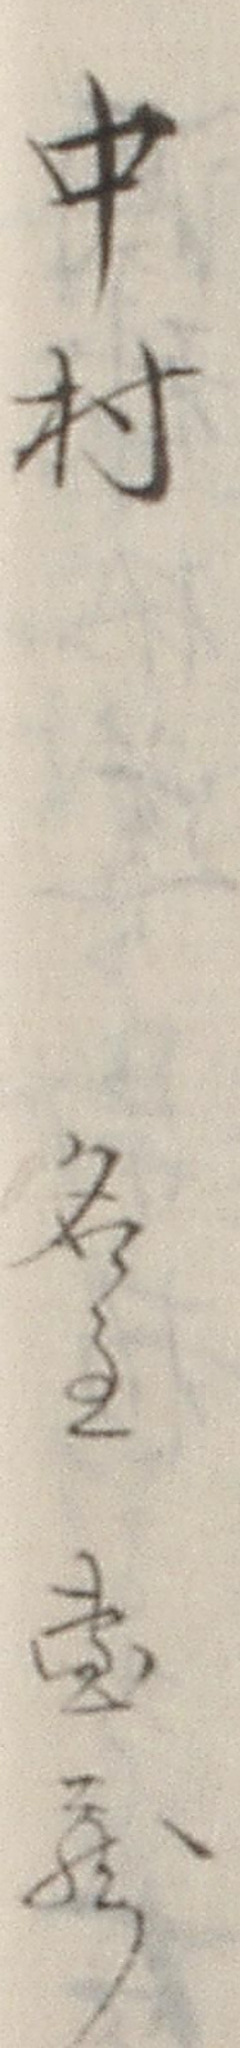中村名主留蔵
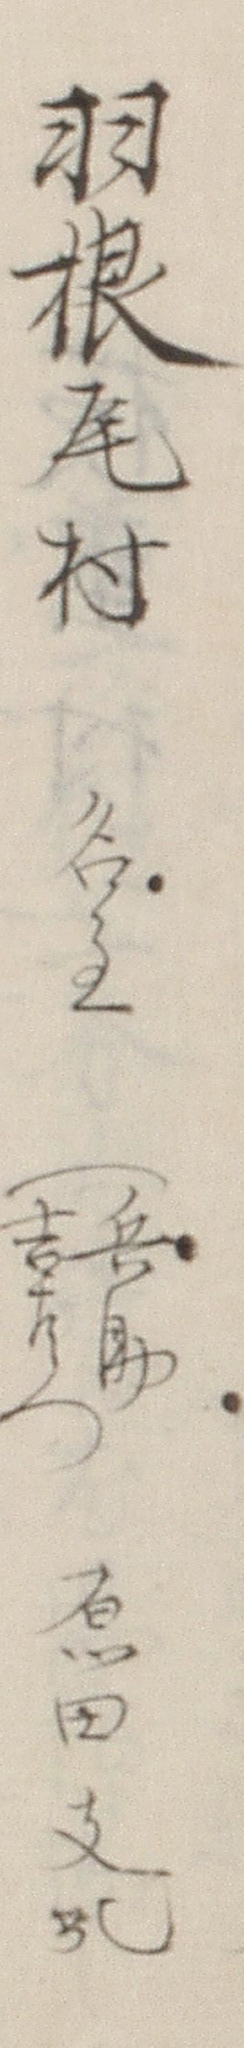羽根尾村名主兵助原田支配
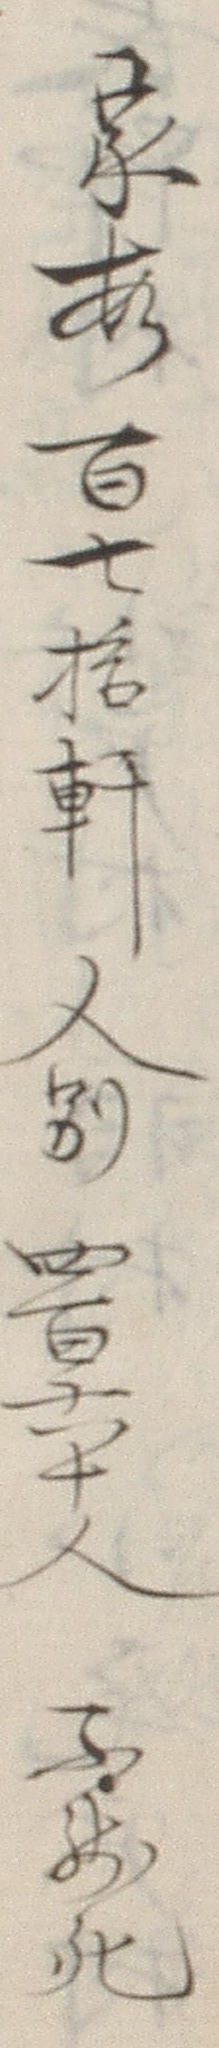家数百七拾軒人別四百六十人不残死
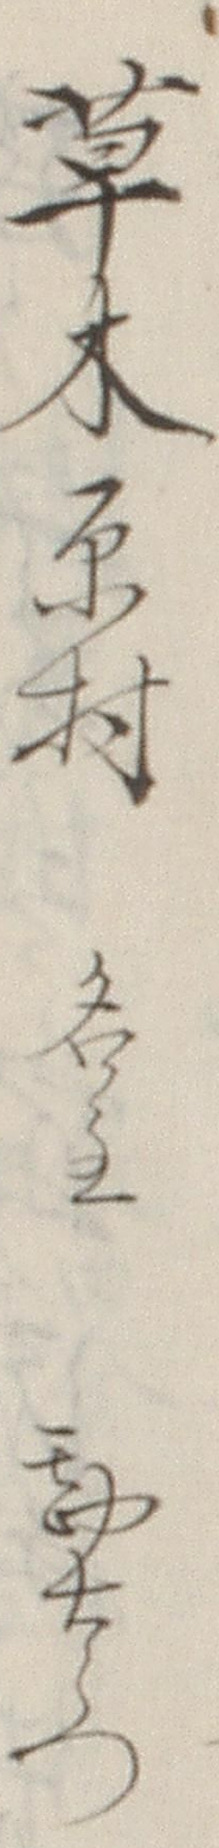草木原村名主勘右衛門
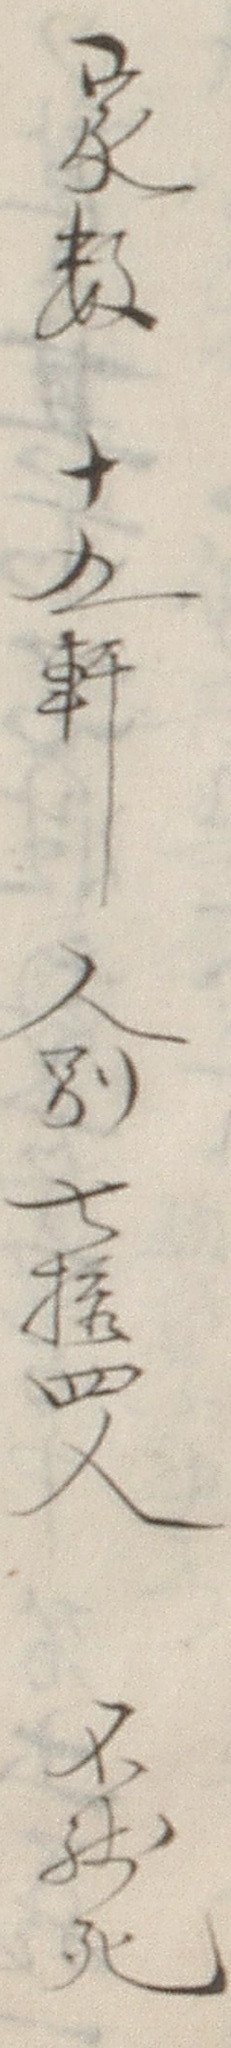家数十九軒人別七拾四人不残死
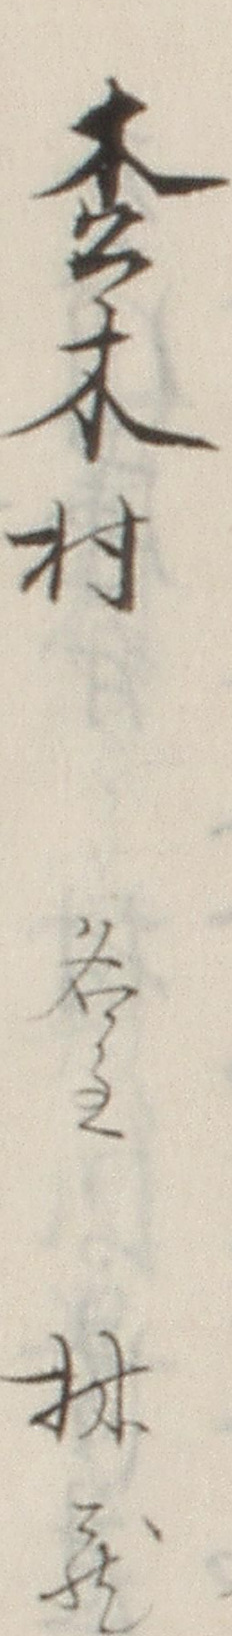松木村名主林蔵
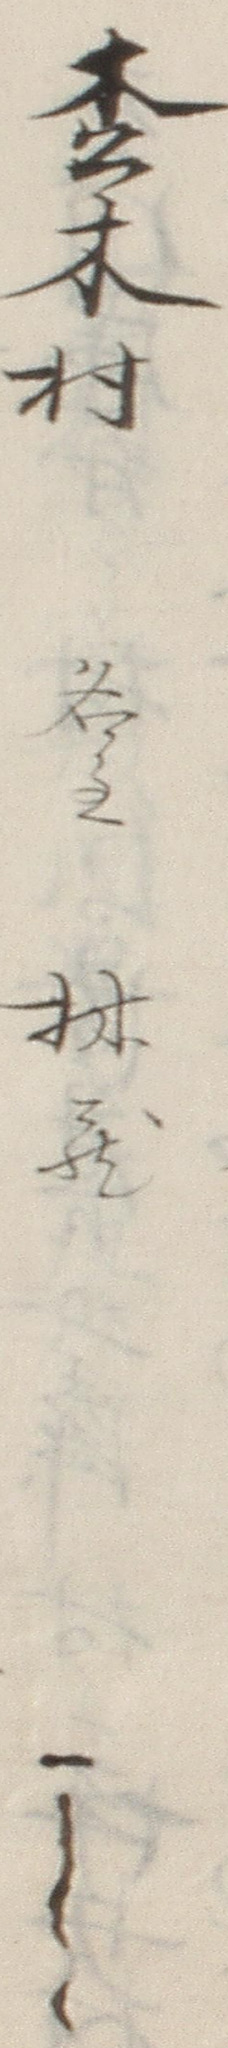松木村名主林蔵
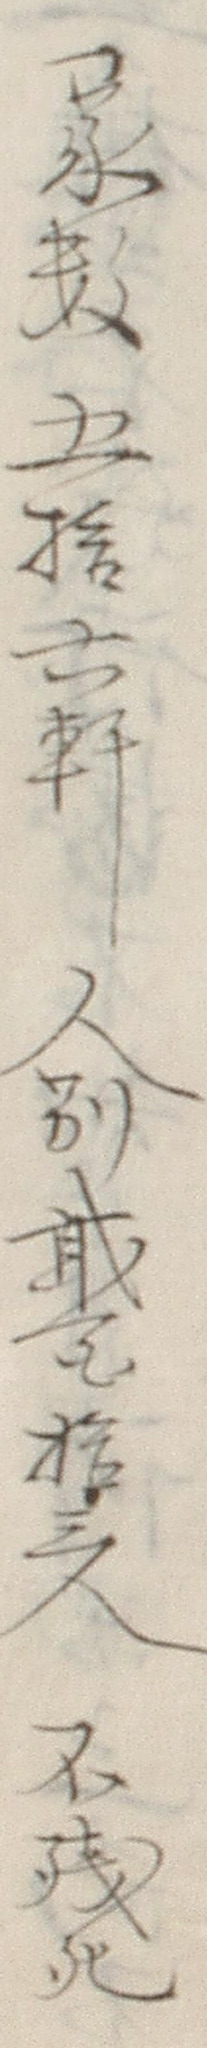家数五拾六軒人別弐百拾三人不残死
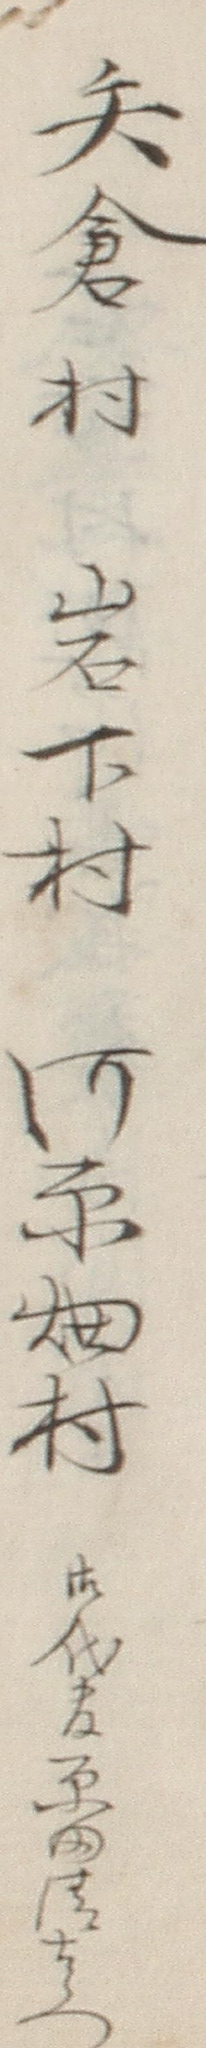矢倉村岩下村河原田村御代官原田清右衛門
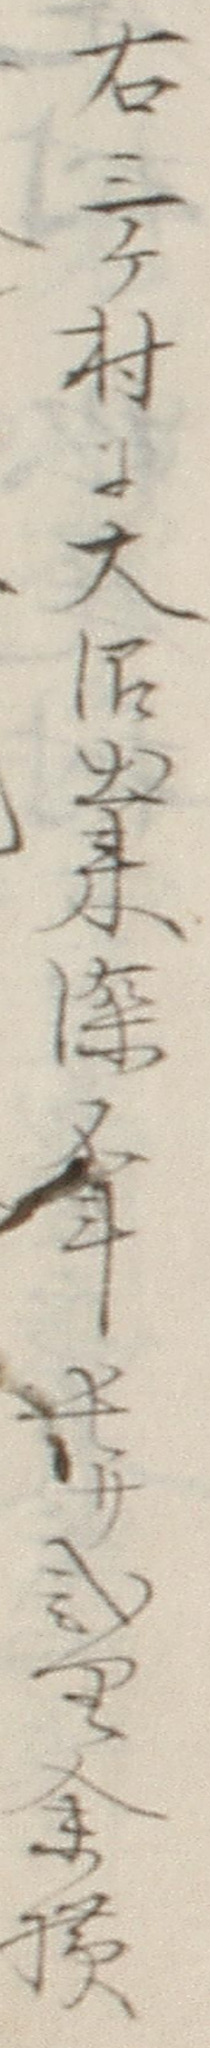右三ケ村に大沼出来深不斗長サ弐里余横
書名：[諸国災害記録]
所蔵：東京大学地震研究所図書室 Earthquake Research Institute Library, The University of Tokyo, JAPAN
